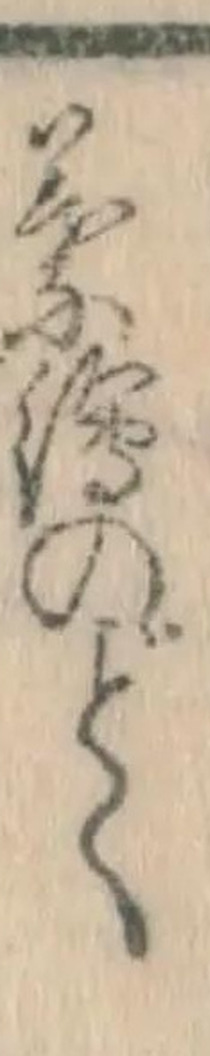葉絵のごとく
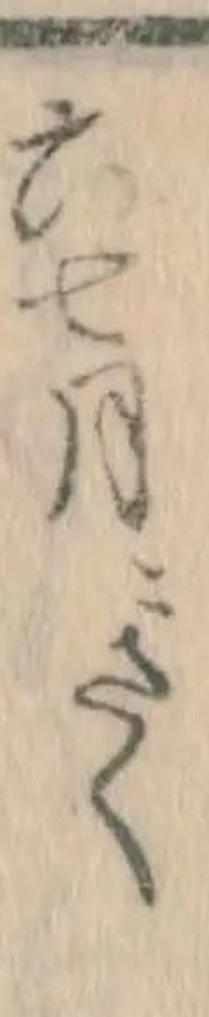六七月にさく
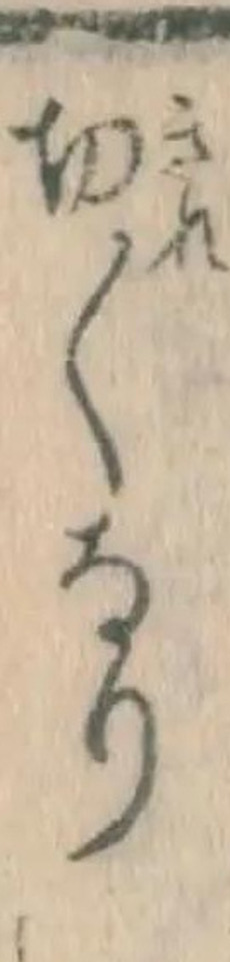切〳〵なり

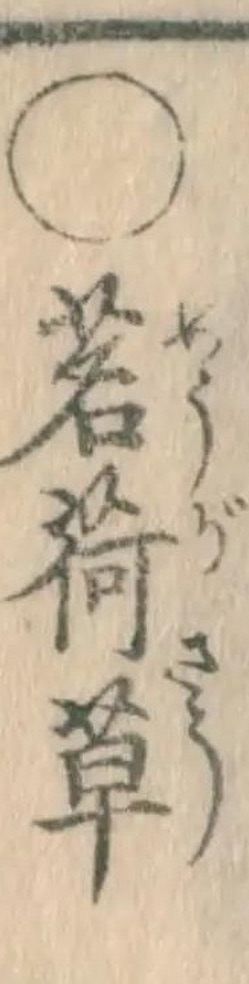〇茗荷草
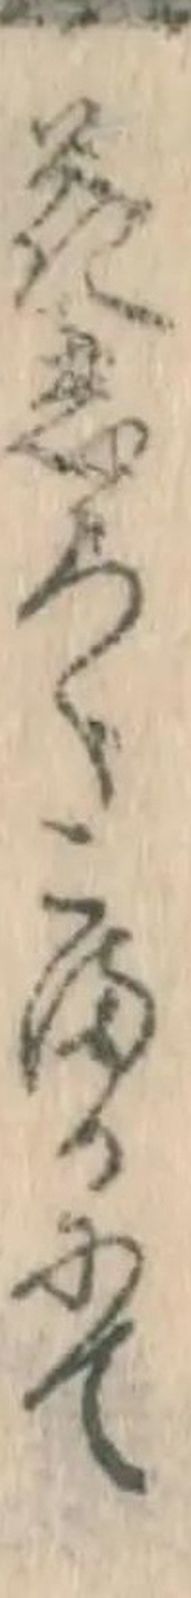花しろくこまかにて
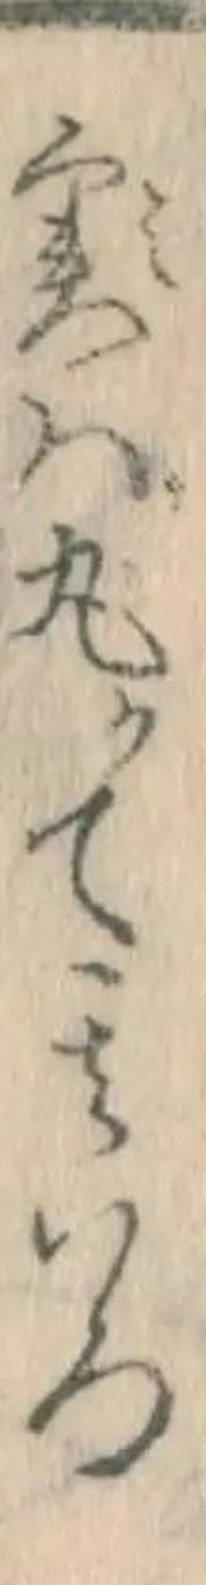実は丸くて其いろ
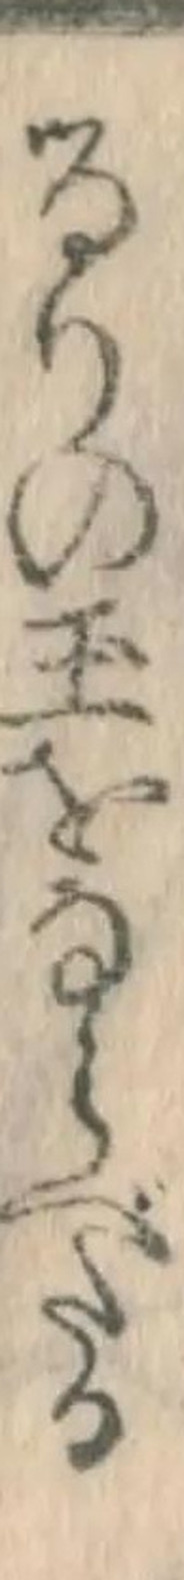るりの玉をなならべたる
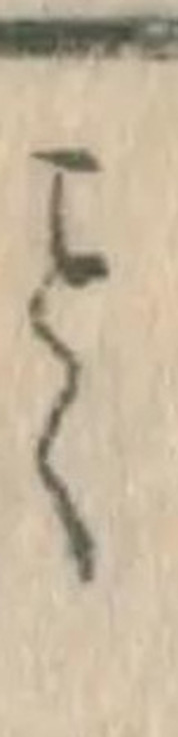ことく
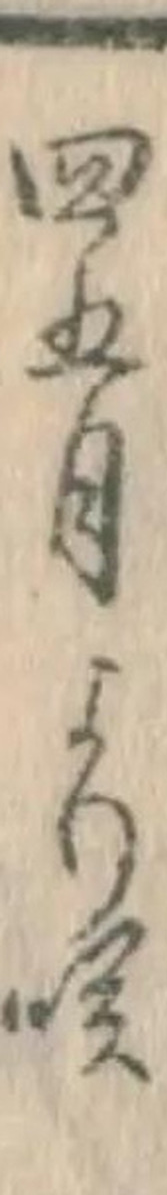四五月より咲
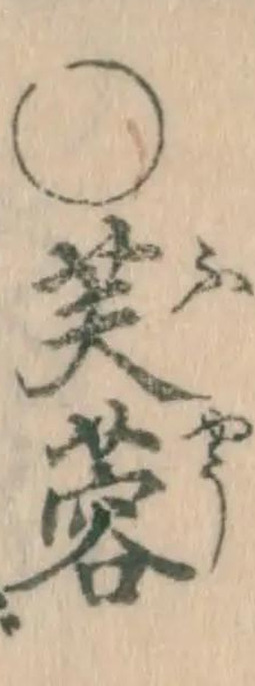〇芙蓉
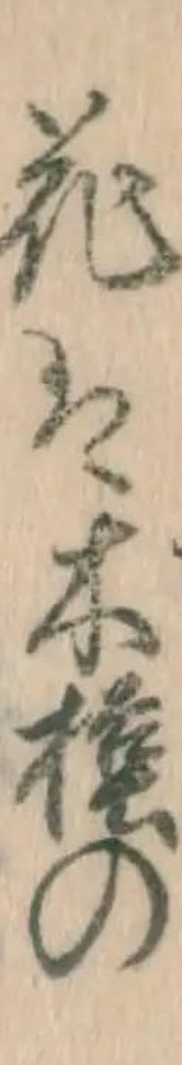花は木槿の
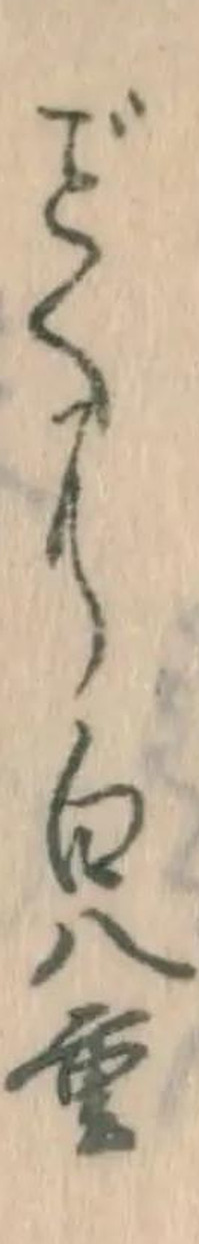ごとくに白八重
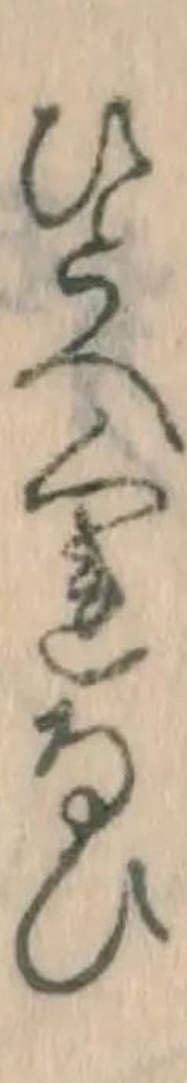ひとへくれなひ
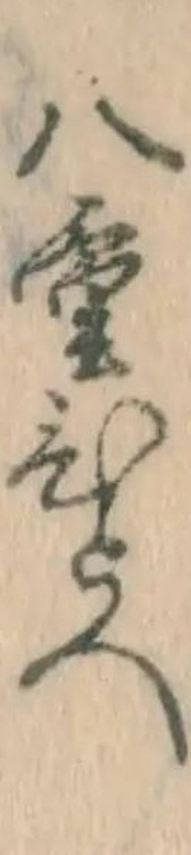八重ひとへ
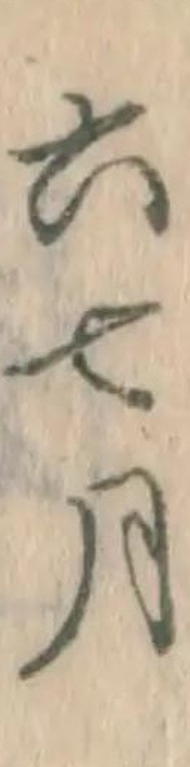六七月

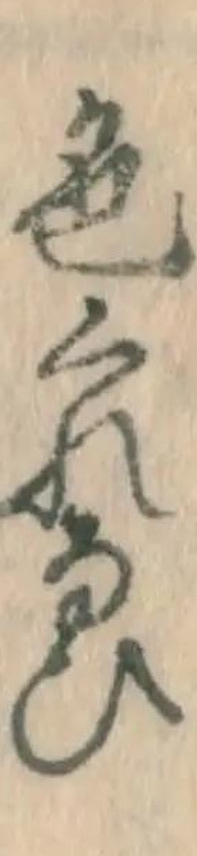色くれなひ
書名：艸花繪前集. [2]
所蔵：国立国会図書館 National Diet Library, JAPAN
